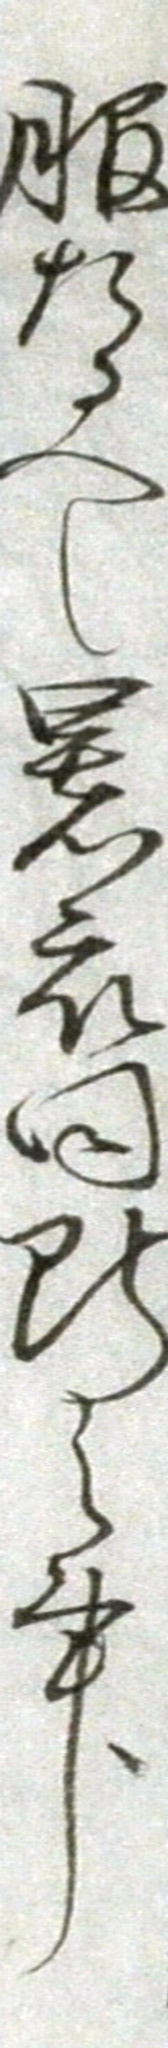服たるへし暑衣同断之事
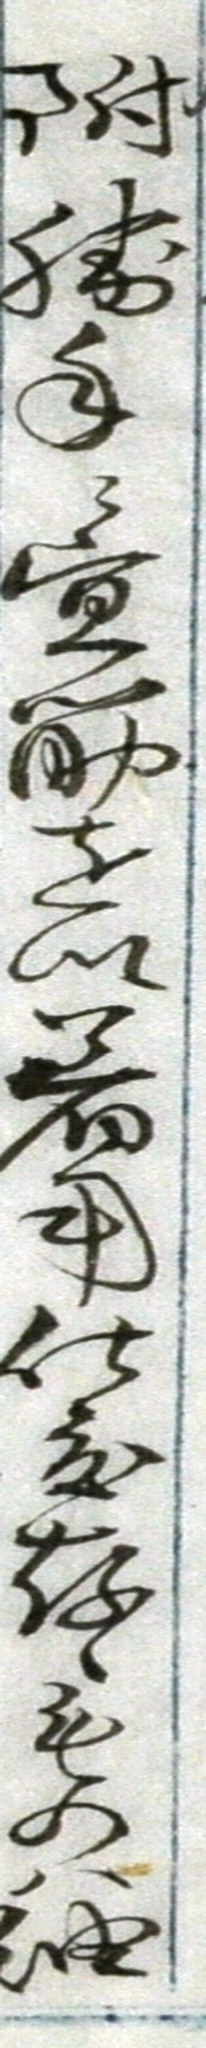附勝手ニ宜筋を以着用仕度存候ものハ紬
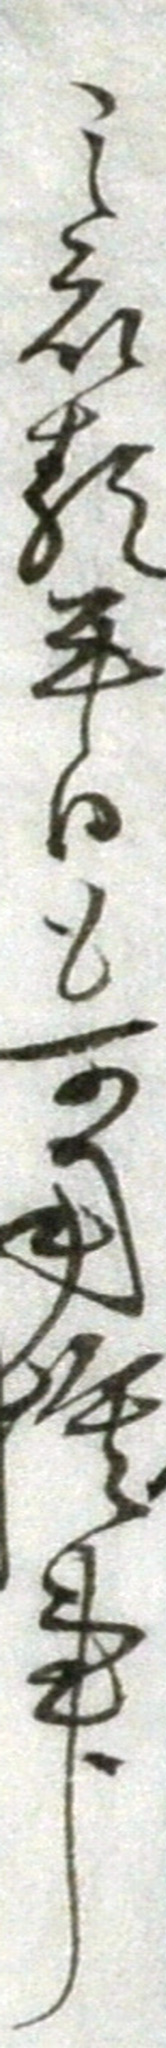之衣類平日も可用捨事
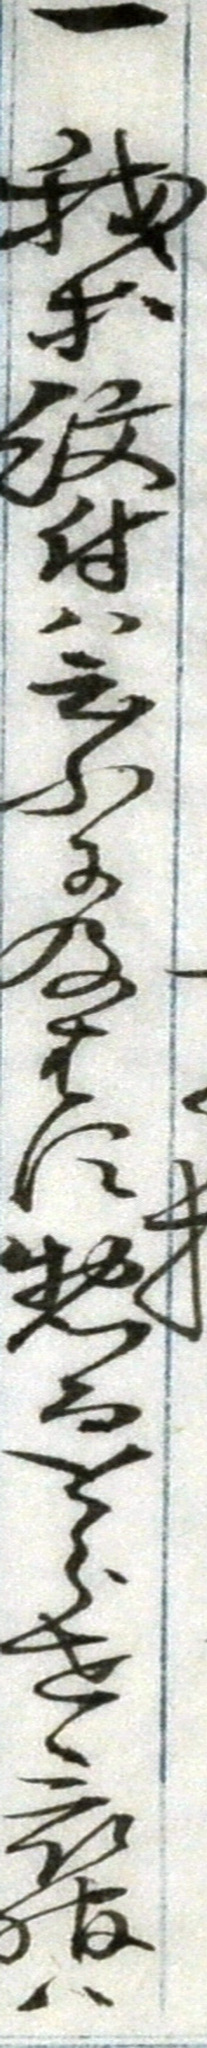一我等紋付ハ云ふに及はす惣而とらせ候衣服ハ
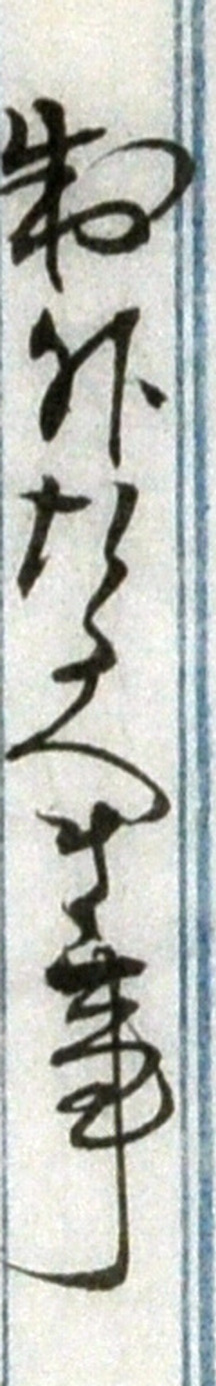制外たるへき事
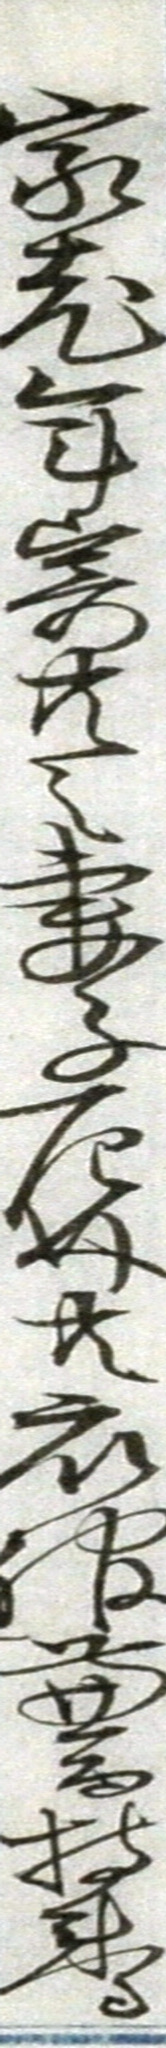一家老年寄共之妻子厄介共衣服兼而持来る
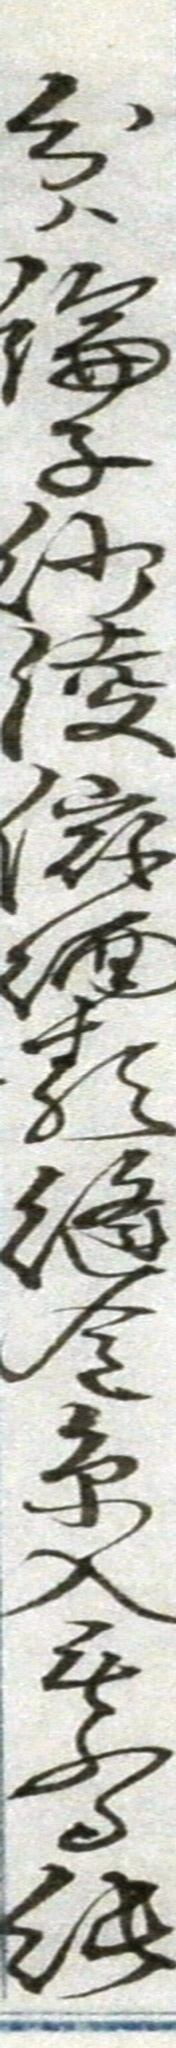分ハ綸子紗綾縮緬類縫金糸入もふる純
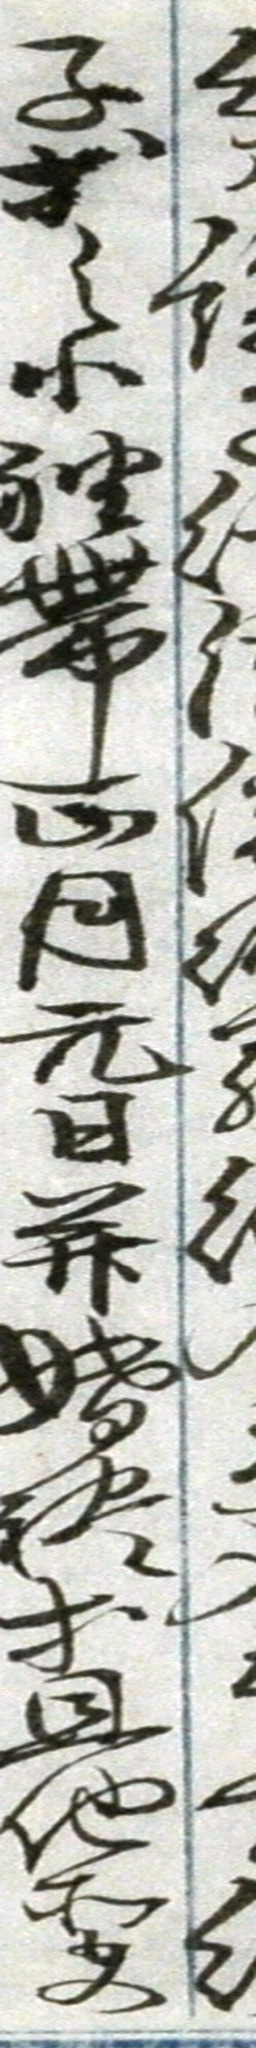子等之小袖帯正月元日并婚礼等且他所もの
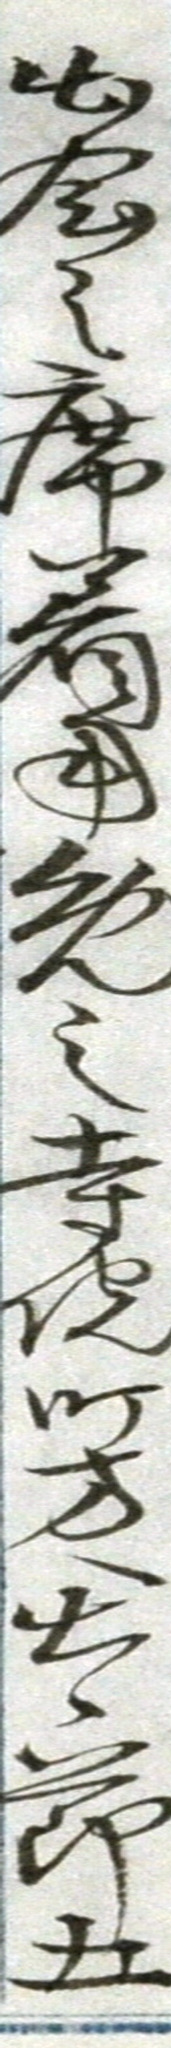出会之席着用免之寺院町方へ出候節五
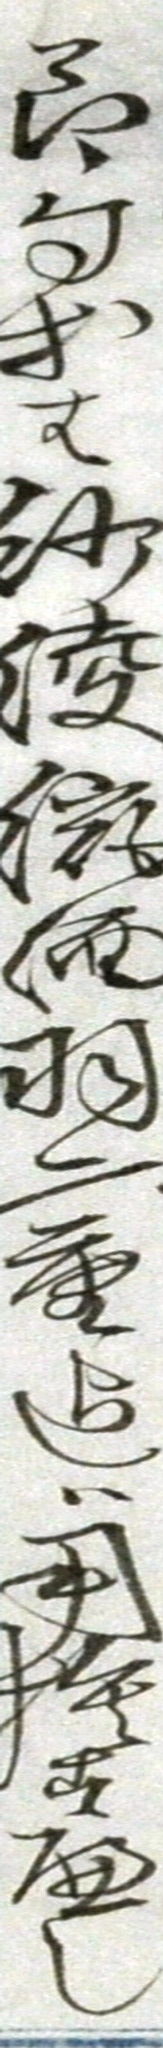節句等は紗綾縮緬羽二重迄ハ用捨すへし
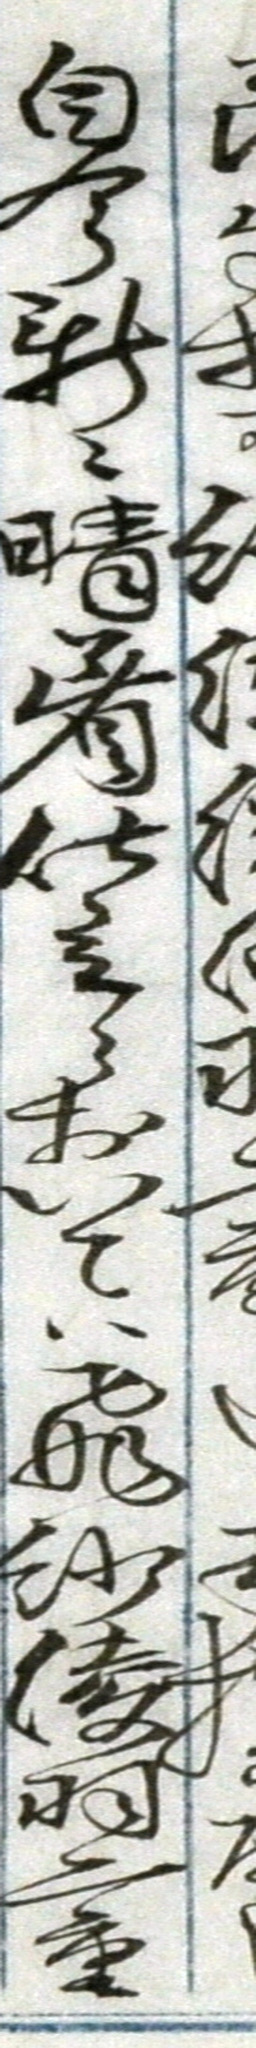自今新ニ晴着仕立ニおいてハ飛紗綾羽二重
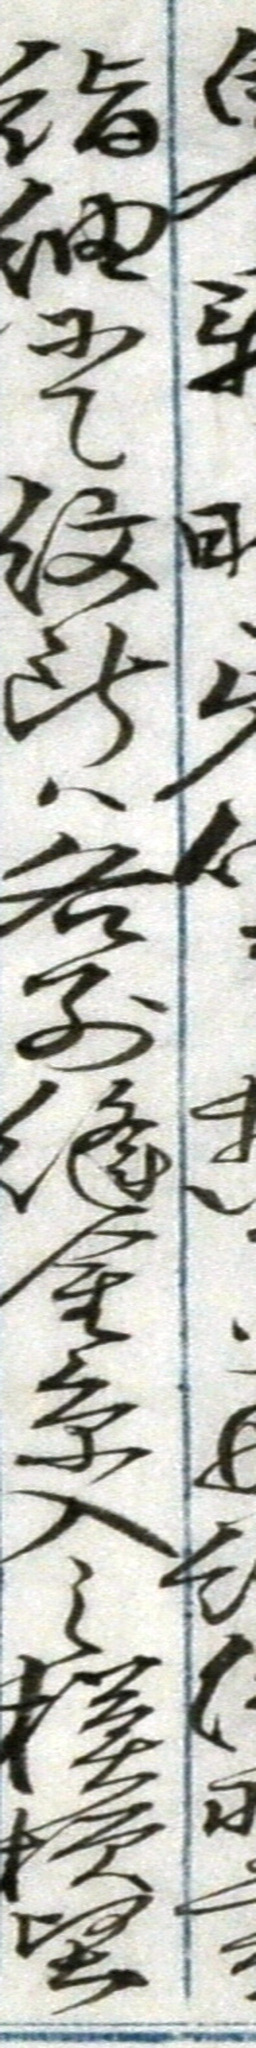絹紬にて紋所ハ各別縫金糸入之模様堅
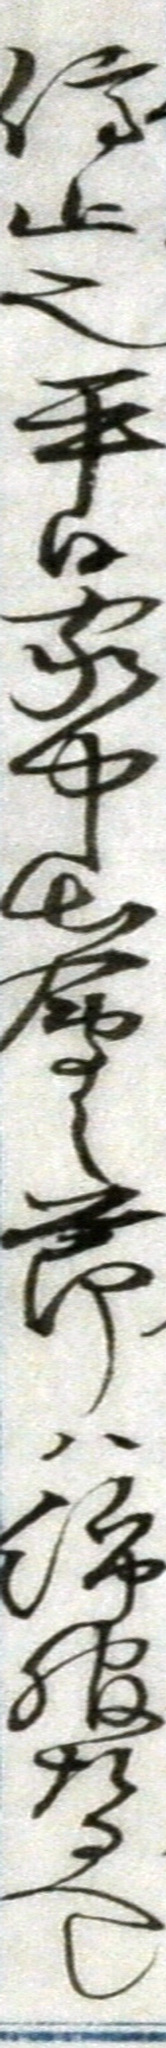停止也平日家中出会之節ハ綿服たるへし
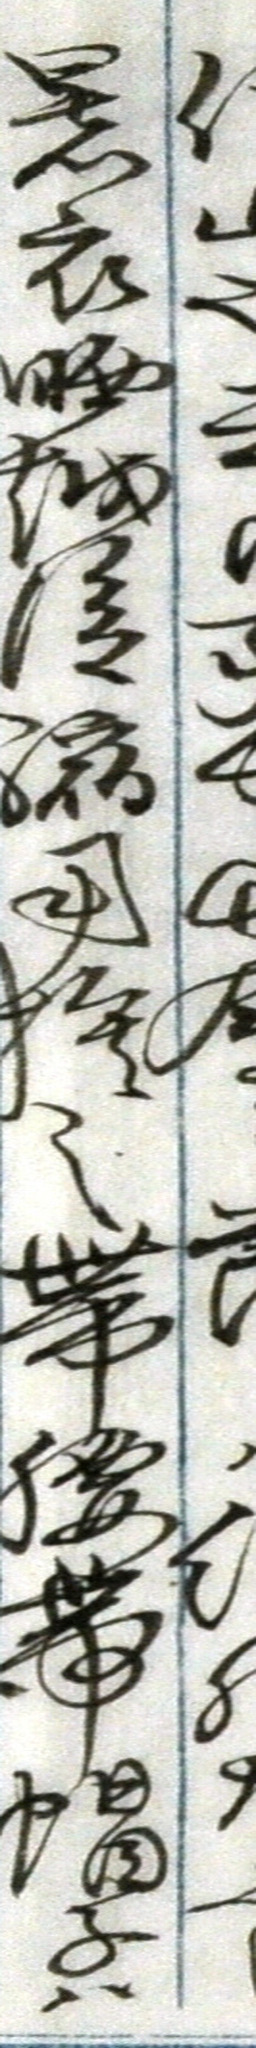暑衣晒越後縮用捨之帯腰帯帽子ハ
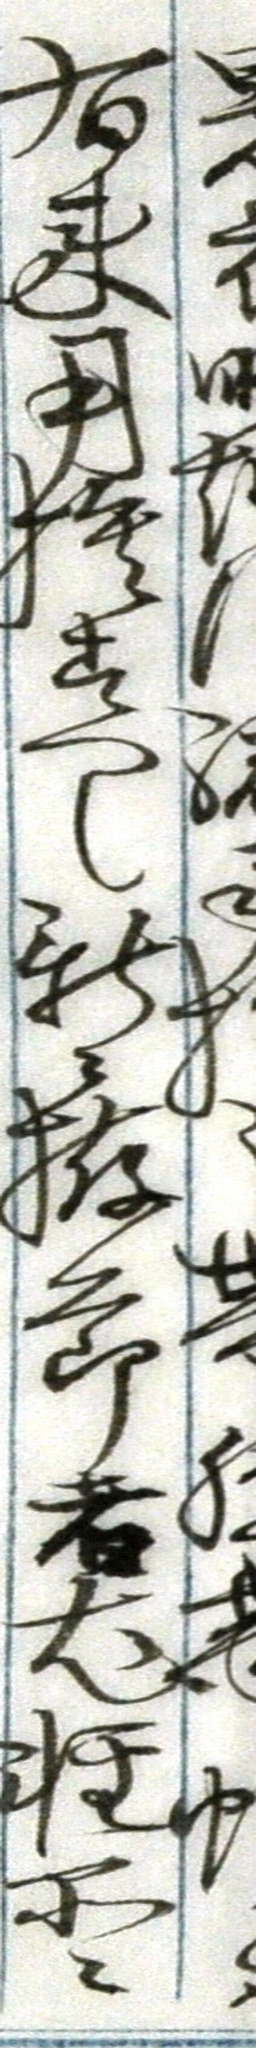有来用捨すへし新ニ拵節者尤軽品ニ
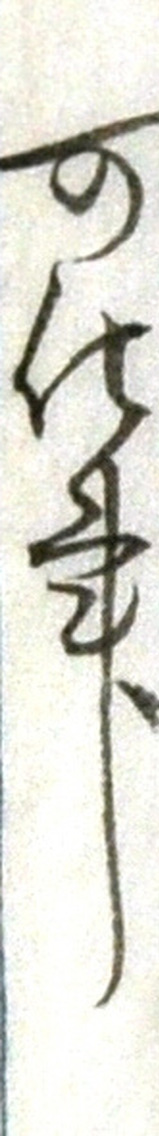可仕事
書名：頼由公（源隆院殿）御定
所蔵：伊那市立高遠町図書館・合同会社AMANE
